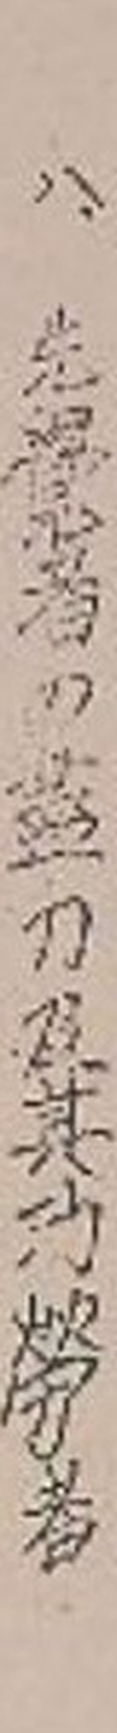ハ先覚者の尽力及其功労者
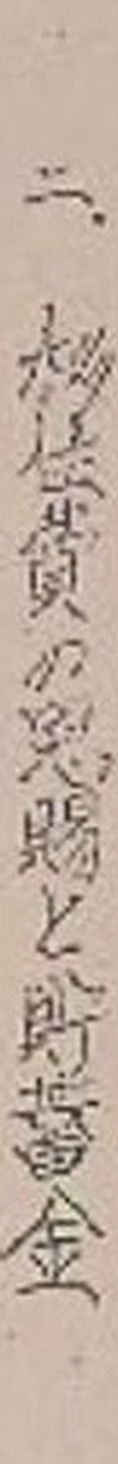ニ移住費の恩賜と貯蓄金
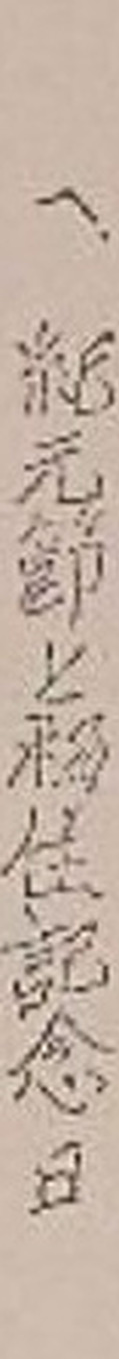ヘ紀元節と移住記念日
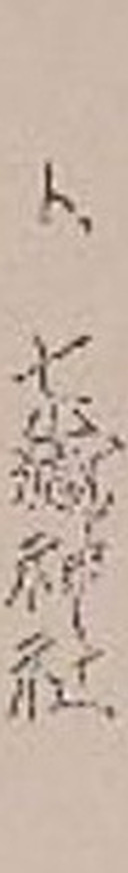ト七嶽神社
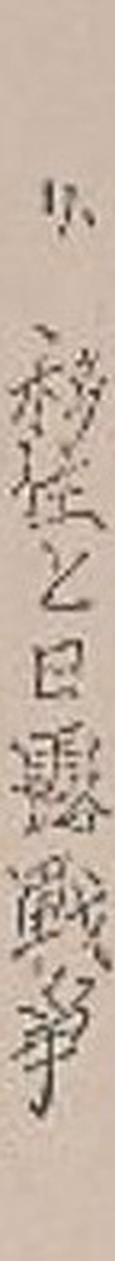リ移住と日露戦争
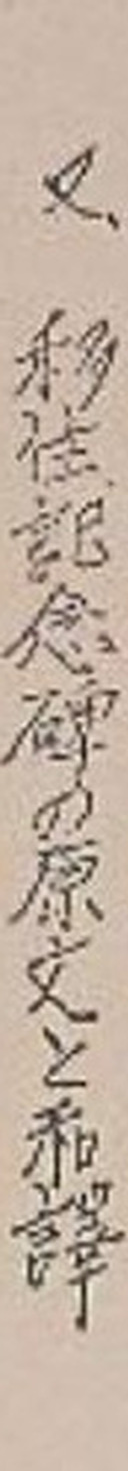ヌ移住記念碑の原文と和訳
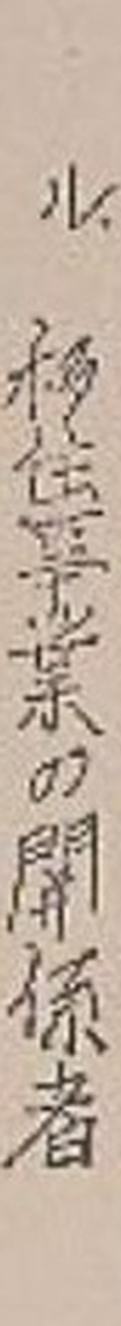ル移住事業の関係者
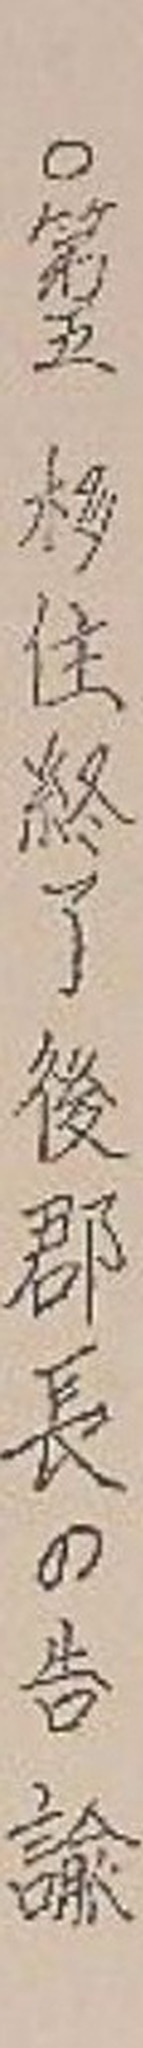○第五移住終了後郡長の告諭
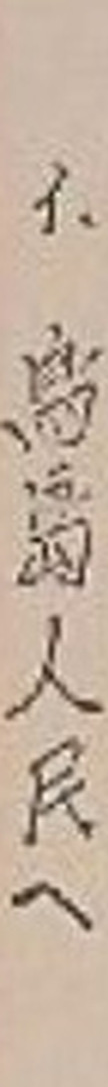イ鳥島人民へ
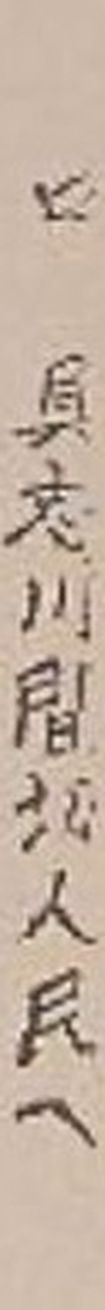ロ具志川間切人民へ
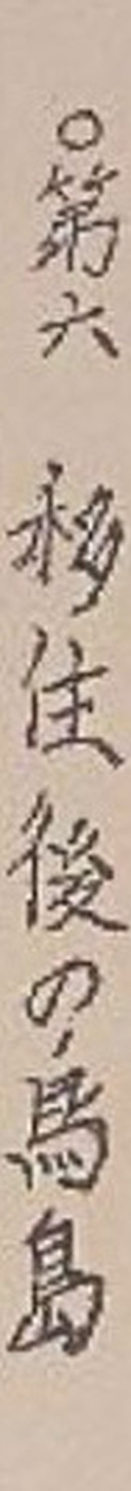○第六移住後の鳥島
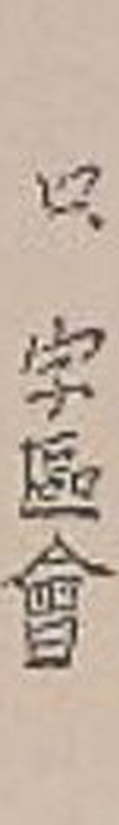ロ字区会
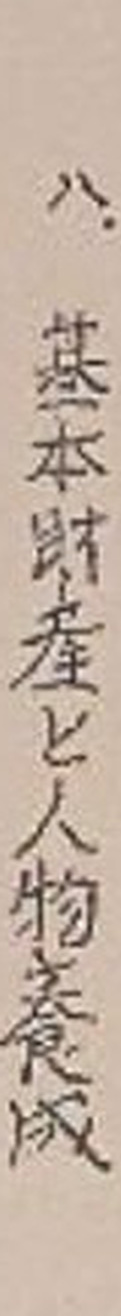ハ基本財産と人物養成
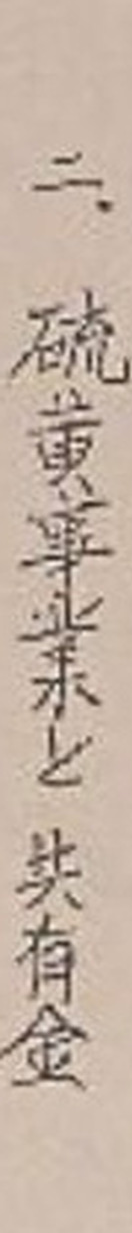ニ硫黄事業と共有金
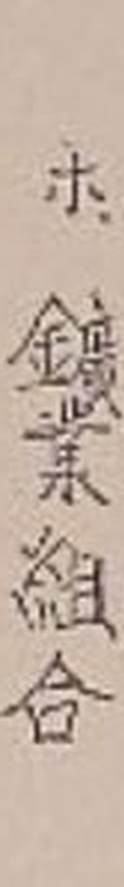ホ鉱業組合
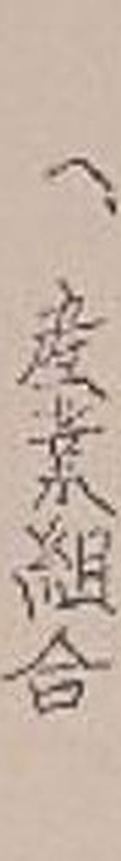ヘ産業組合
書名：鳥島移住始末
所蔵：University of the Ryukyus Library
